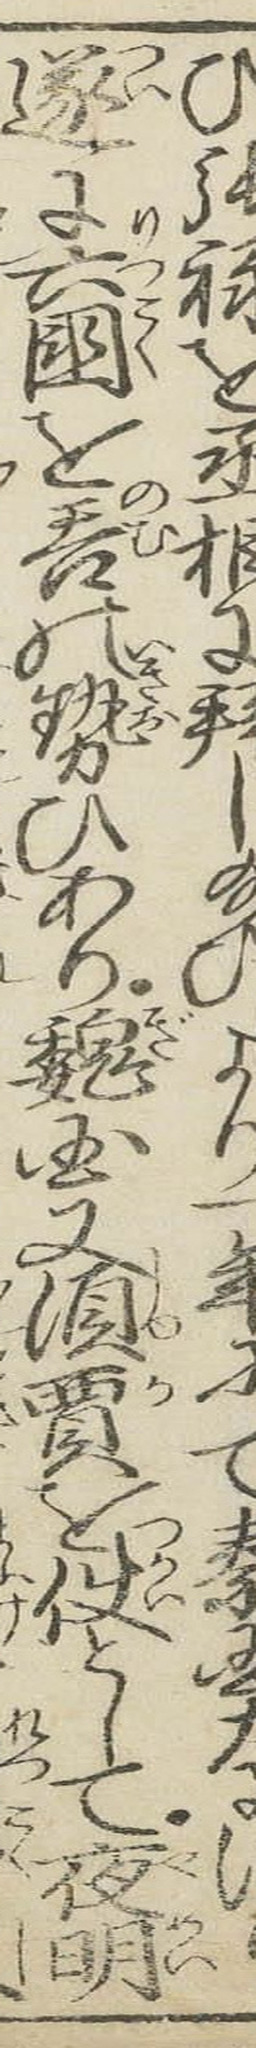遂に六国を呑の勢ひあり。魏国又須賈を使として。夜明
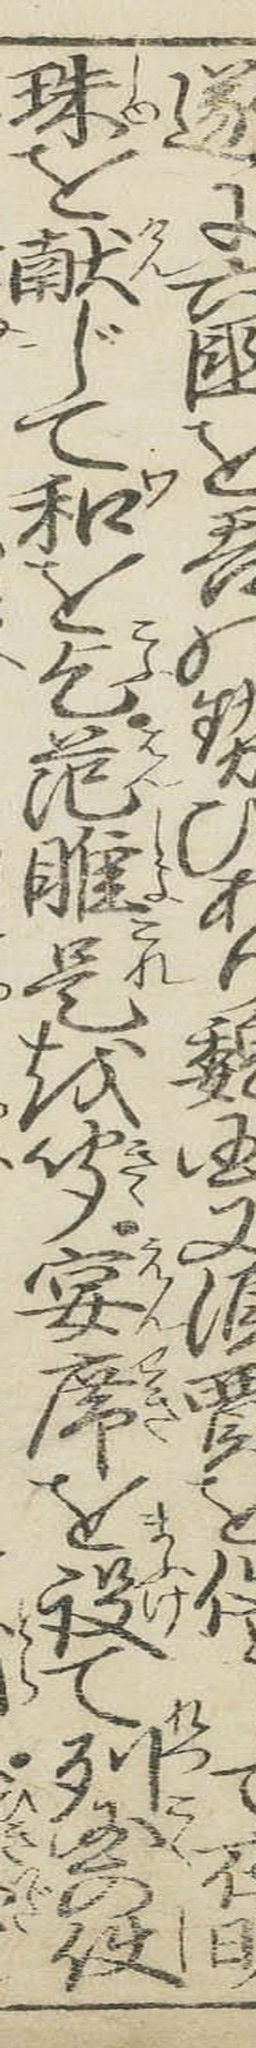珠を献じて和を乞。范雎是を聞。宴席を設て列国の使
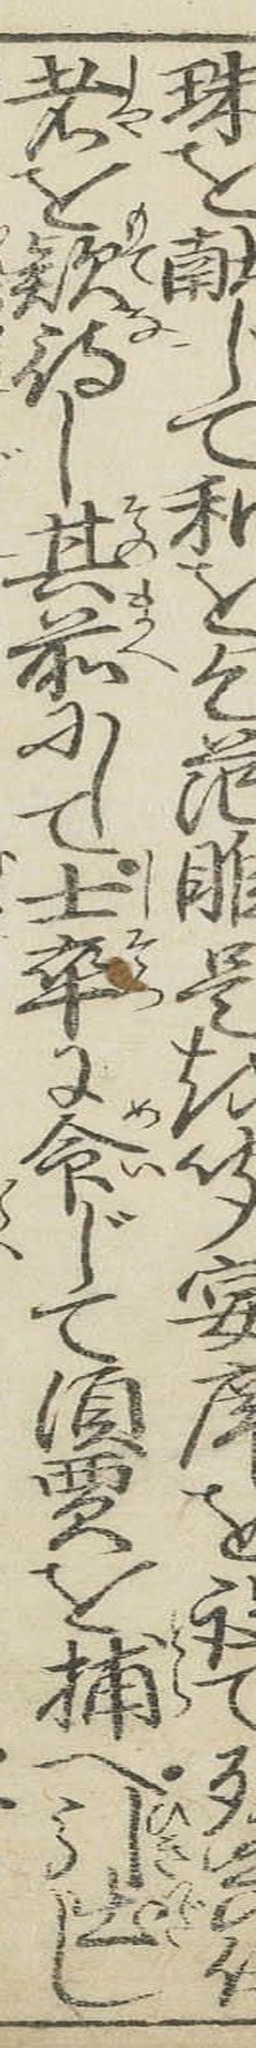者を款待し其前にして。士卒に命じて須賈を捕へ。引出し
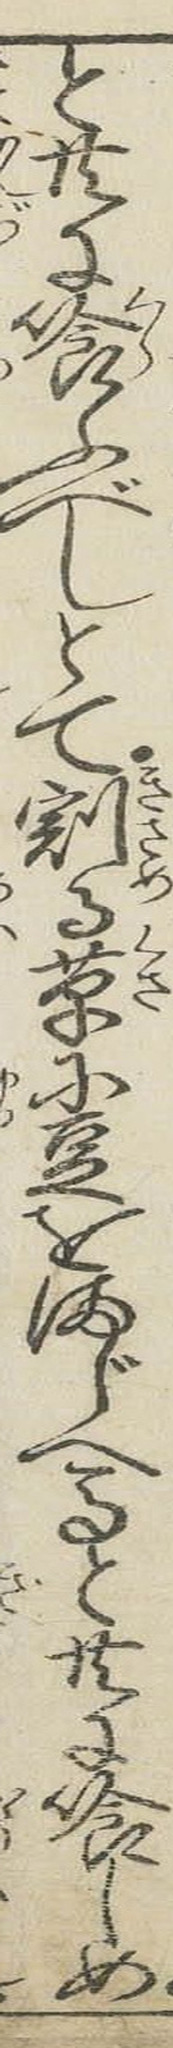と共に喰ふべしとて。割る草に豆をまじへ馬と共に喰しめ。
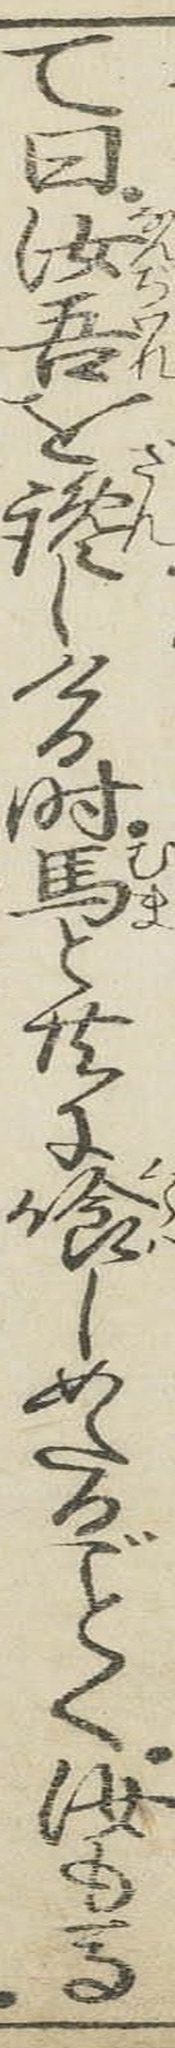て曰。汝吾を讒しける時。馬と共に喰しめたるごとく。汝も馬
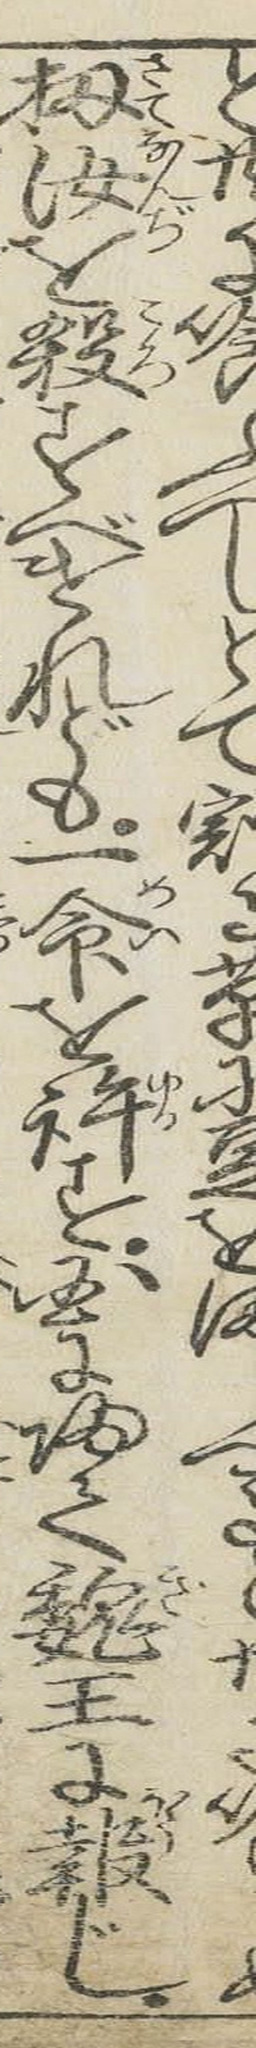扨汝を殺すべけれども。一命を許す。国に帰て魏王に報じ。
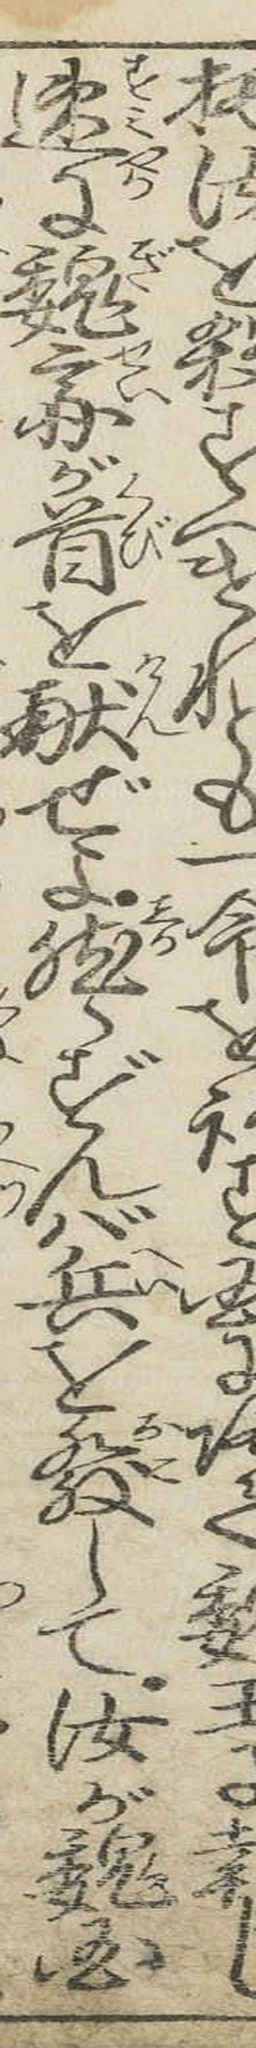速に魏斉が首を献ぜよ。然らずんば兵を発して。汝が魏国
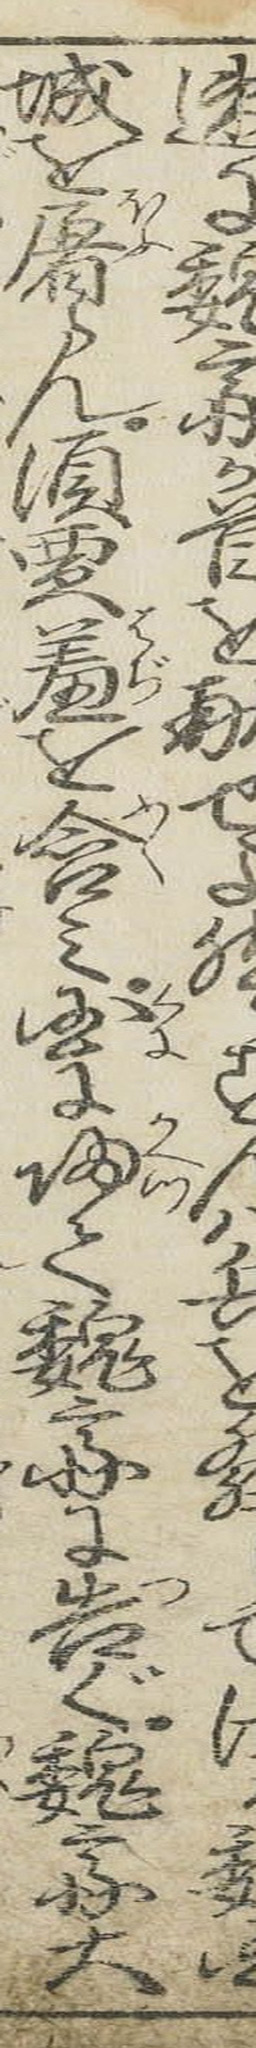城を屠らん。須賈羞を含み。国に帰て魏斉に告ぐ。魏斉大
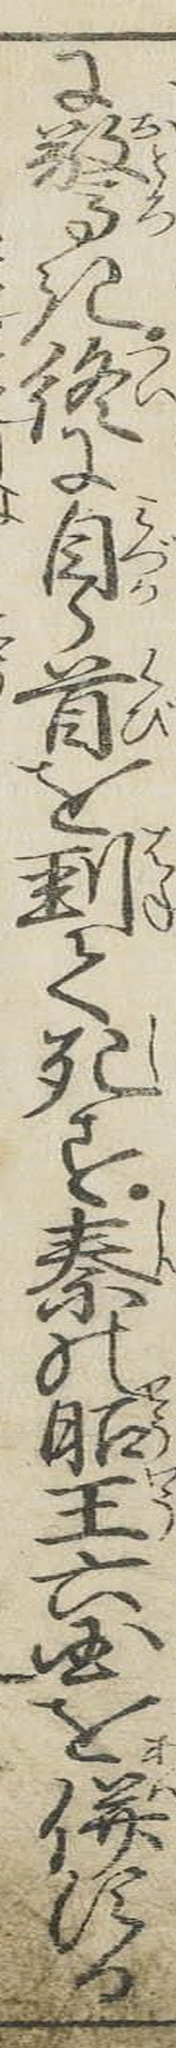に驚き。終に自ら首を刲て死す。秦の昭王六国を併する
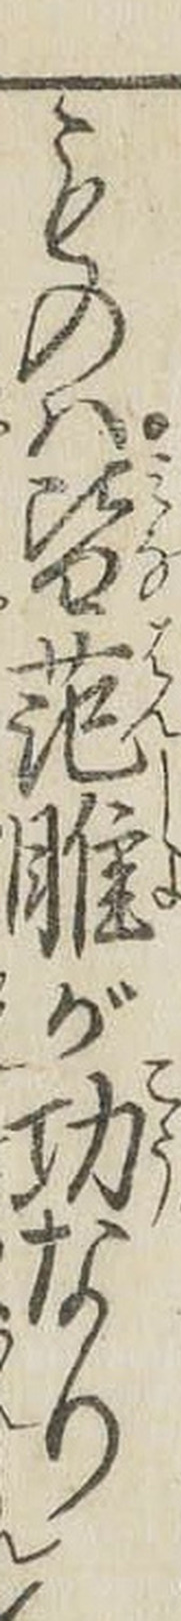ものは。皆范雎が功なり
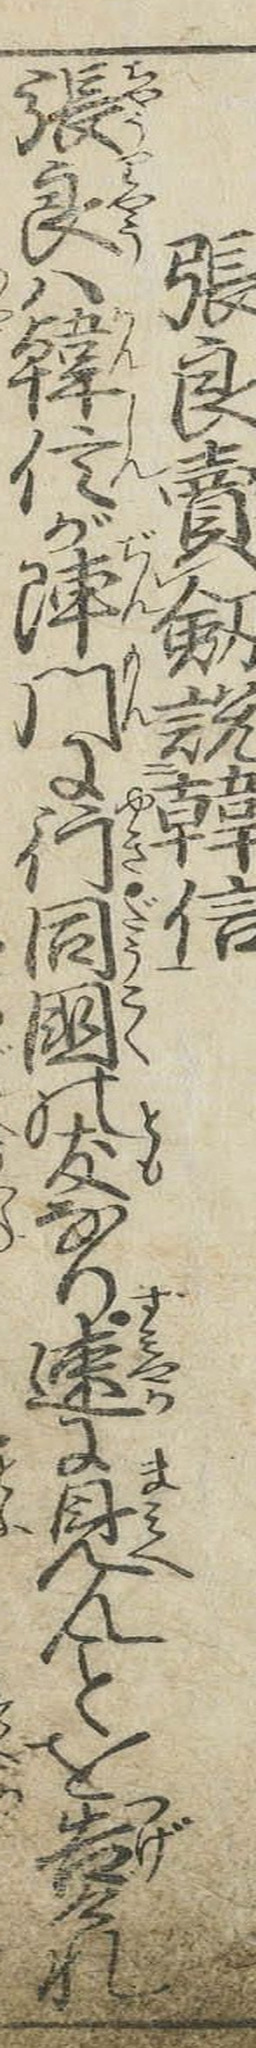張良は韓信が陣門に行。同国の友なり。速に見んことを告けれ
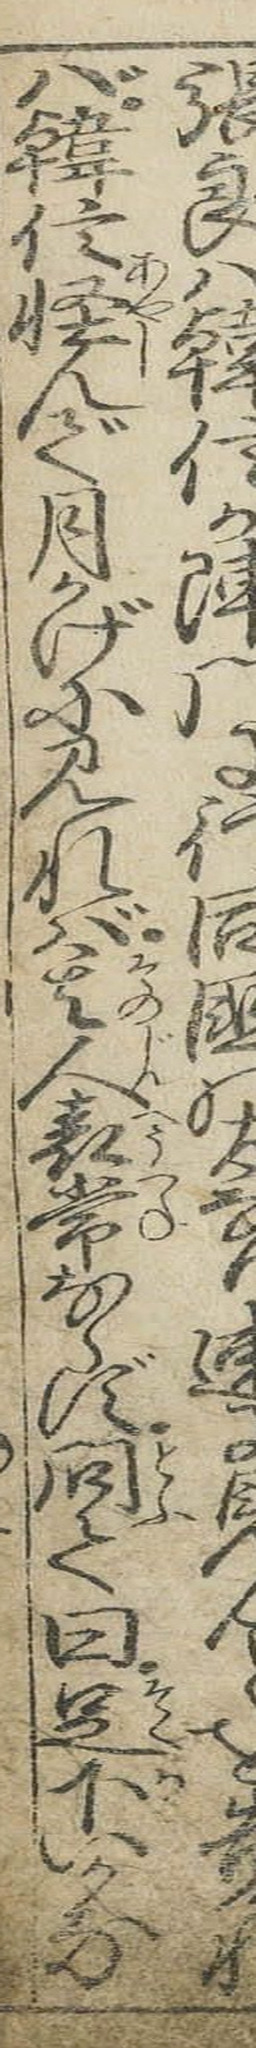ば。韓信怪んで月かげに見れば。其人表常ならず。問て曰。足下いかな

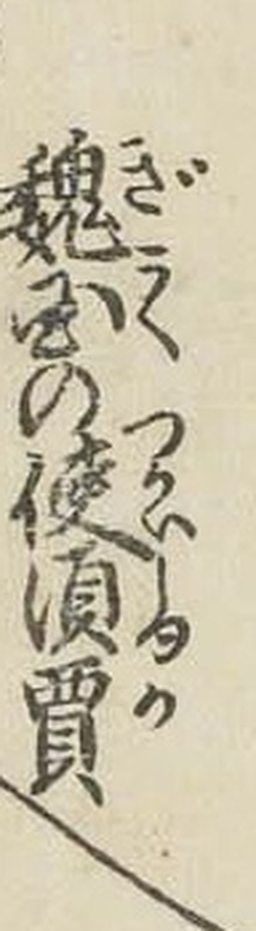魏国の使須賈
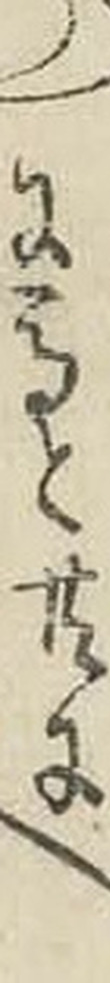に馬と共に
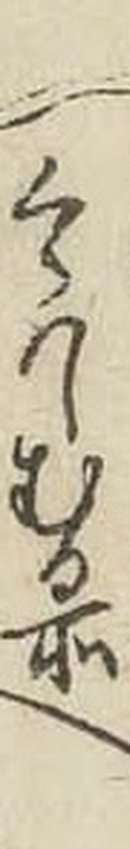くらはしむる所

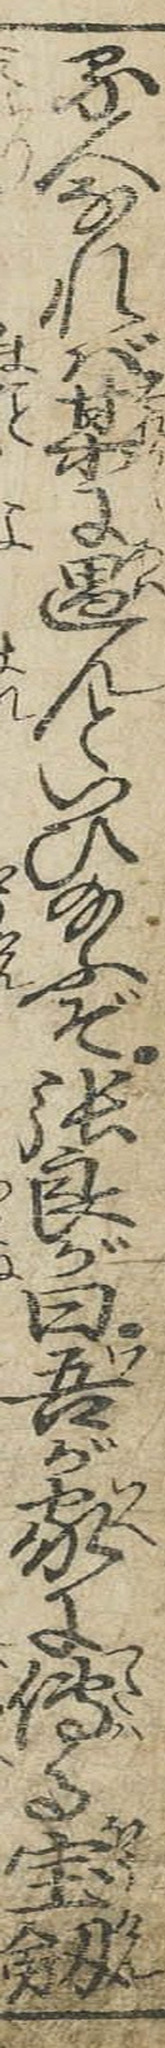る人なれば某に遇んといひ給ふぞ。張良が曰。吾が家に伝る宝剣
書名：絵本写宝袋 9巻 7之巻
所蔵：東京学芸大学教育コンテンツアーカイブ
